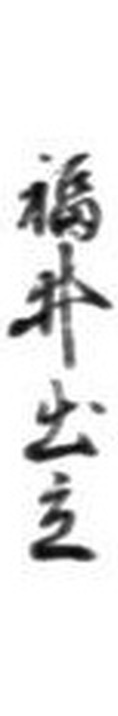福井出立
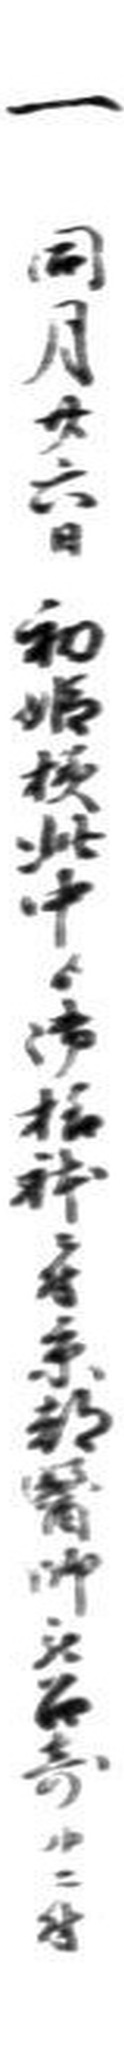一同月廿六日初姫様此中ゟ御様体ニ付京都医師被召寄候ニ付
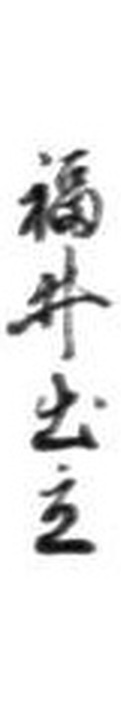福井出立
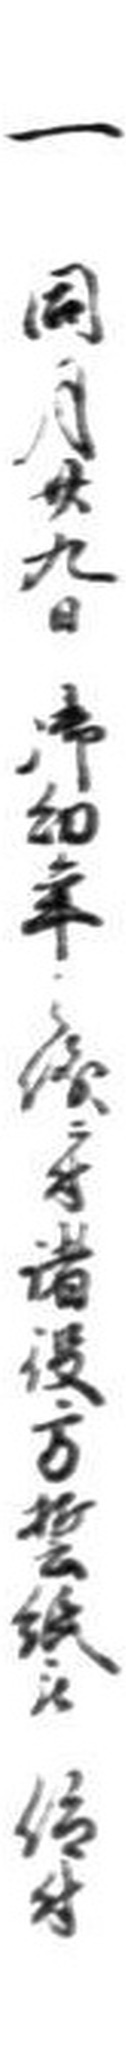一同月廿九日御幼年之儀ニ付諸役方誓紙被仰付
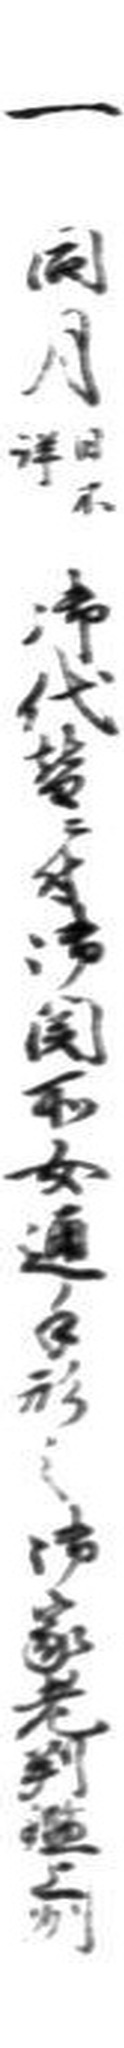詳御代替ニ付御関所女通手形之御家老判鑑上州

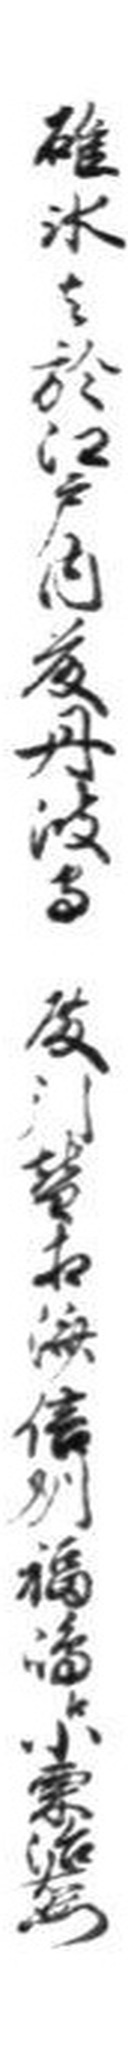碓氷者於江戸内藤丹波守殿引替相済信州福嶋江小栗而治右衛門
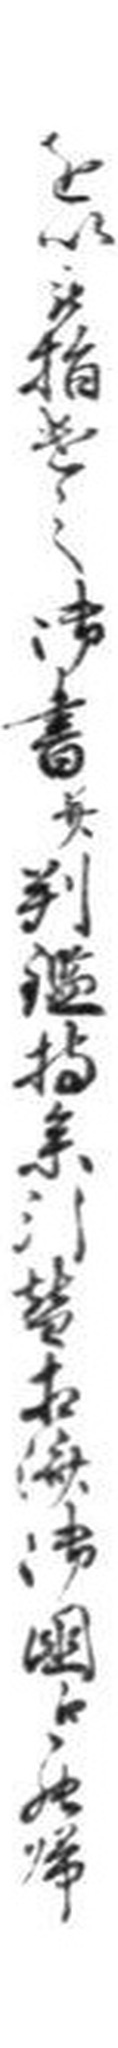を以被指遣之御書并判鑑持参引替相済御国江罷帰
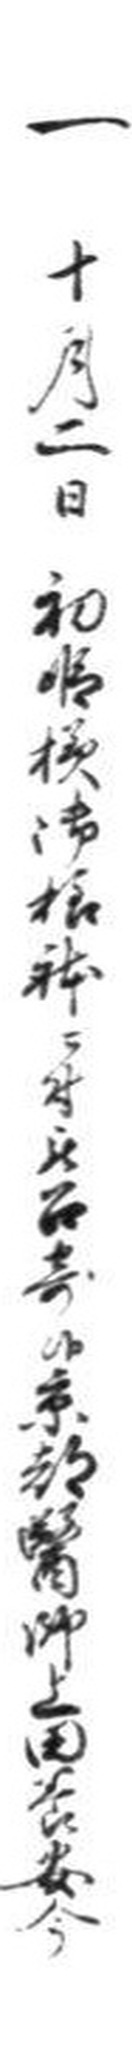一十月二日初姫様御様体ニ付被召寄候京都医師上田養安今
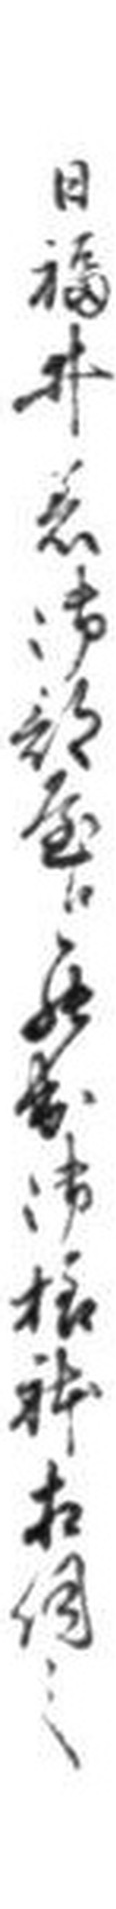日福井着御部屋江罷出御様体相伺之
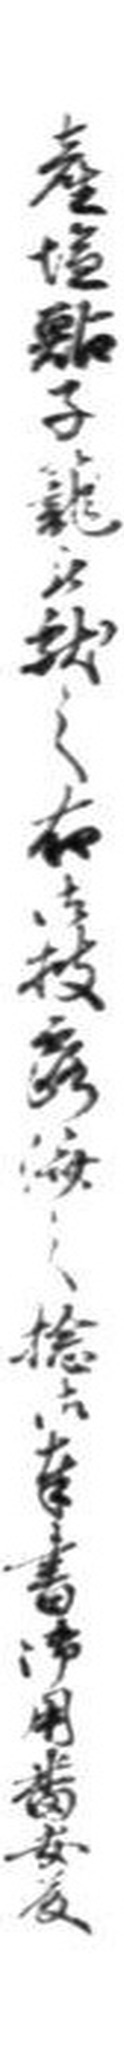産塩鮎子籠被献之右御披露済之捻御奉書御用番安藤
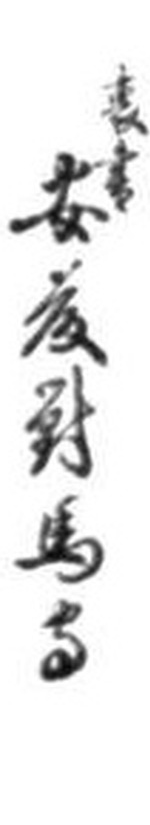安藤対馬守
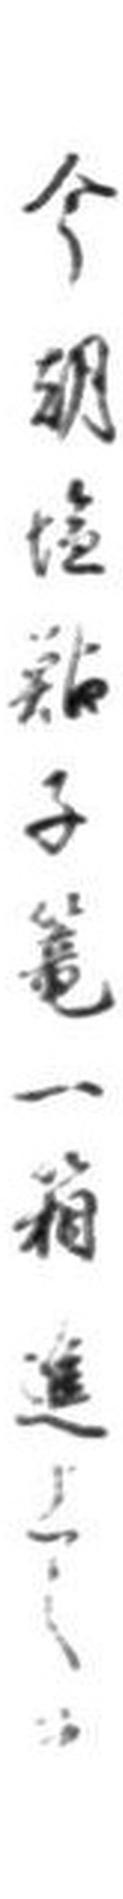今朝塩鮎子篭一箱進上之候
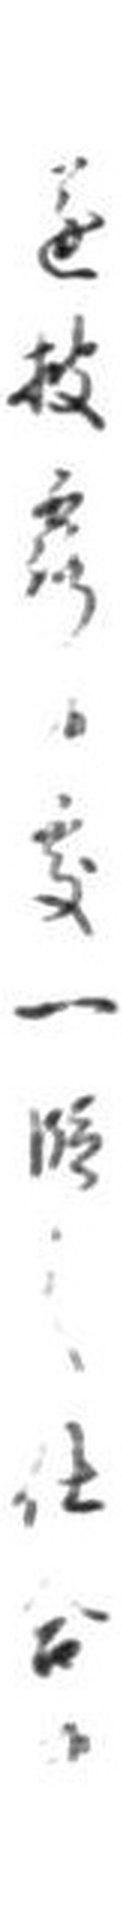遂披露候処一段之仕合候
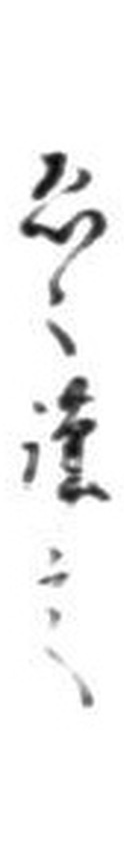恐々謹言
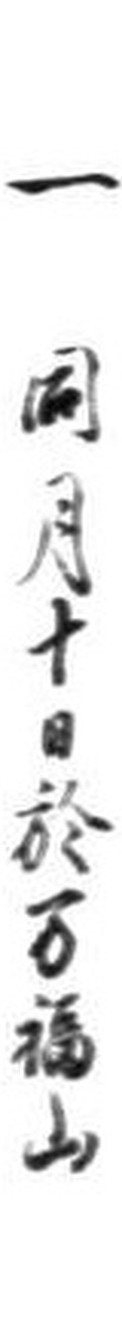一同月十日於万福山
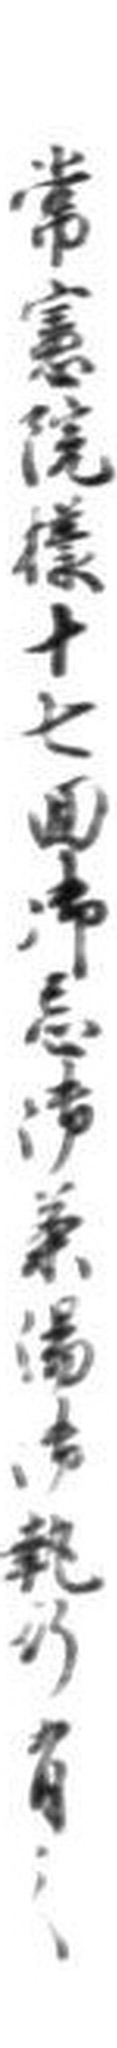常憲院様十七回御忌御茶湯御執行有之
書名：家譜 三十八 宗矩公 従享保九年五月到享保九年十二月
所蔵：福井県文書館 Fukui Prefectural Archives
